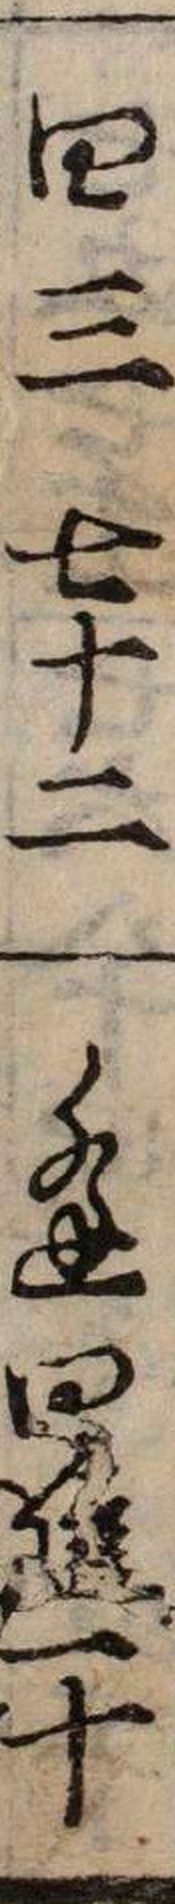四三七十二逢四進一十
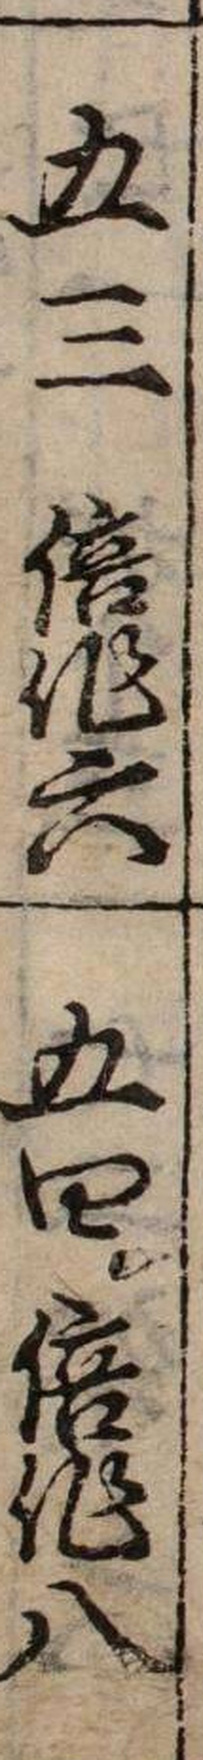五三倍作六五四倍作八
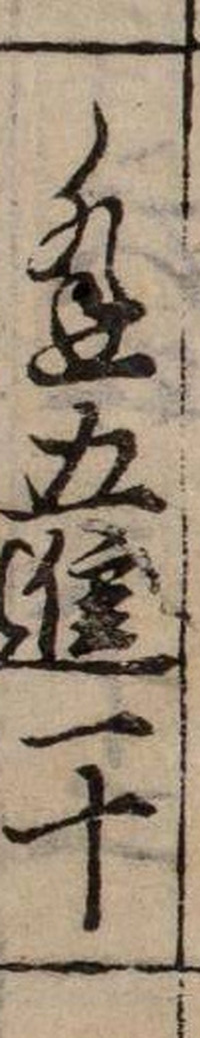逢五進一十

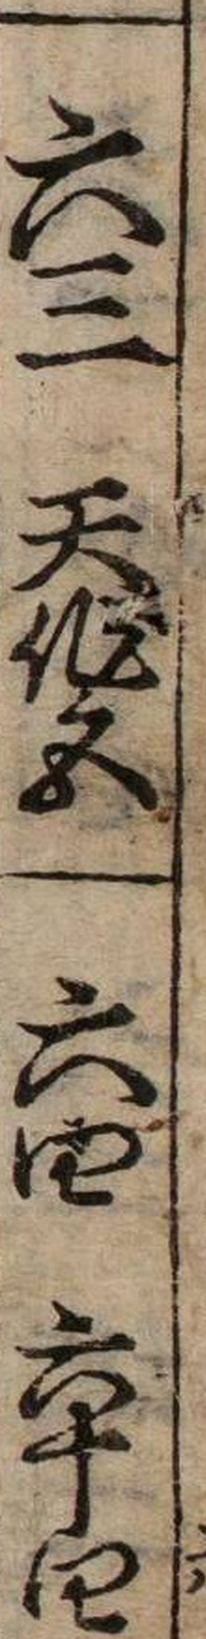六三天作五六四六十四
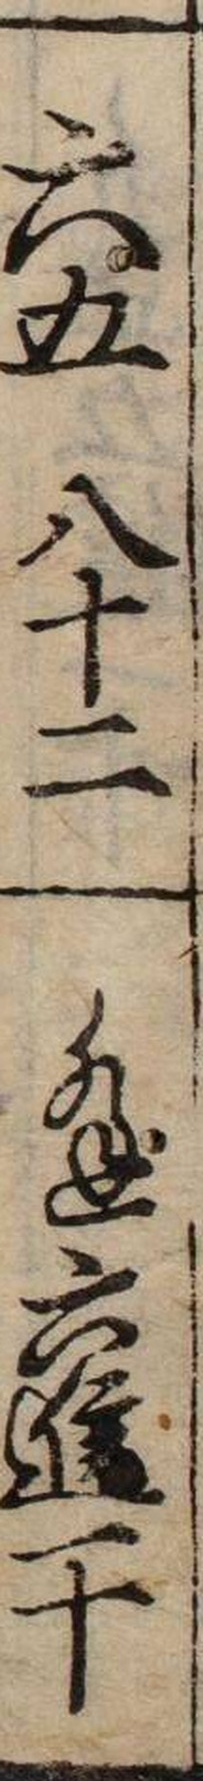六五八十二逢六進一十
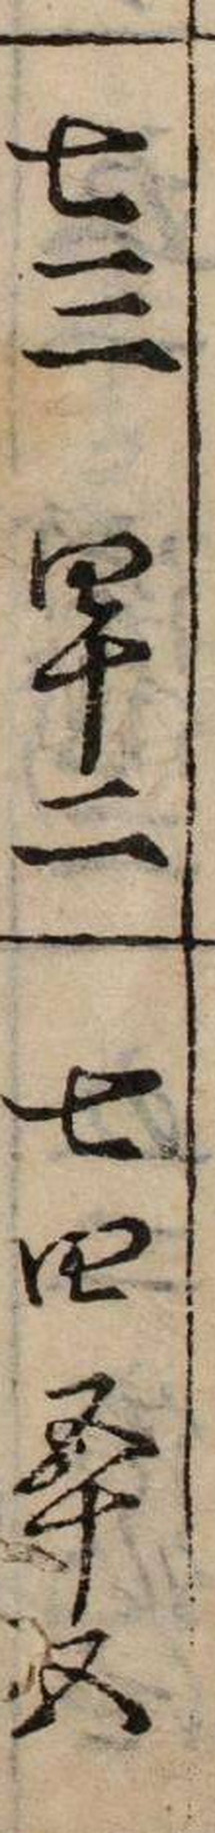七三四十二七四五十六
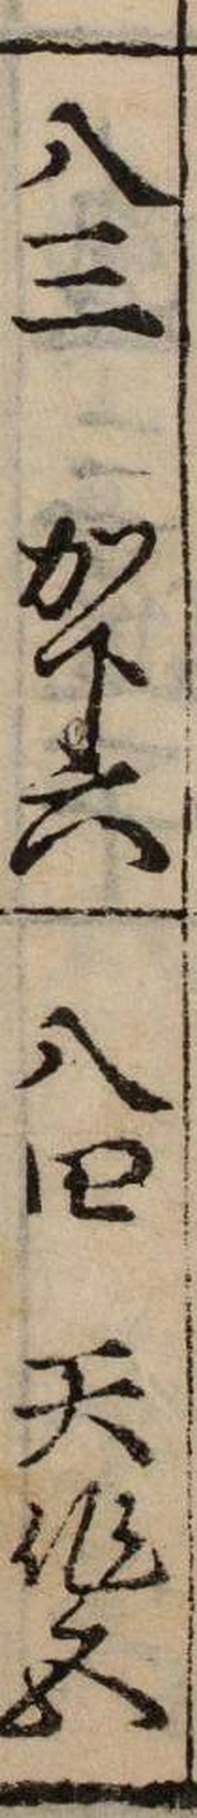八三加下六八四天作五
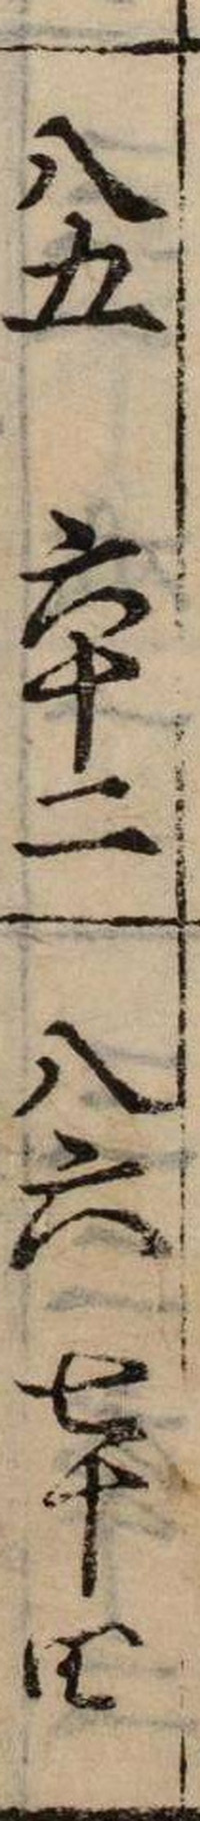八五六十二八六七十四
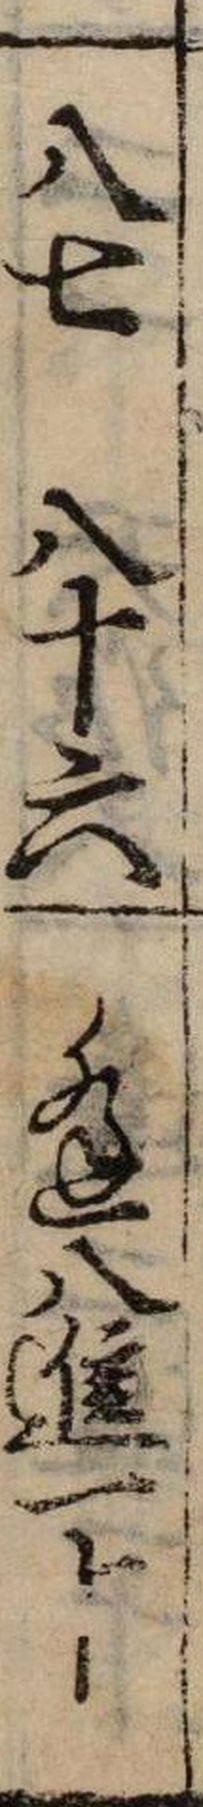八七八十六逢八進一十
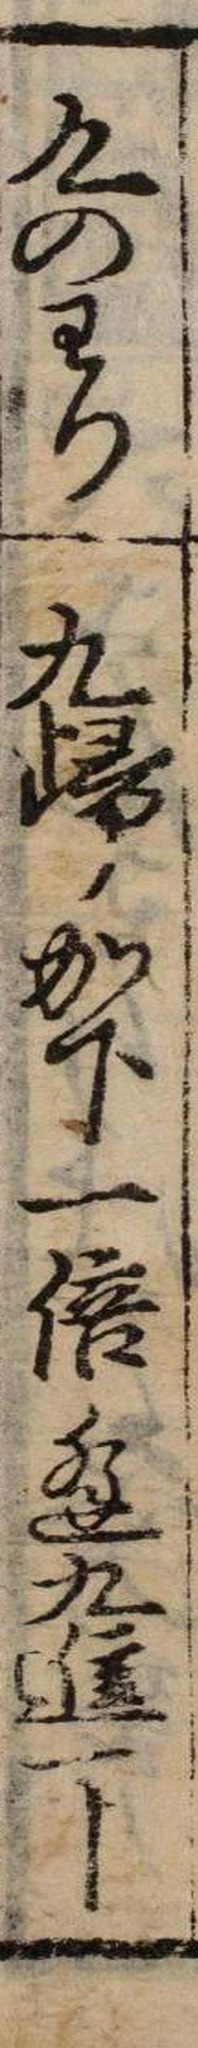九のわり九帰の加下一倍逢九進一十
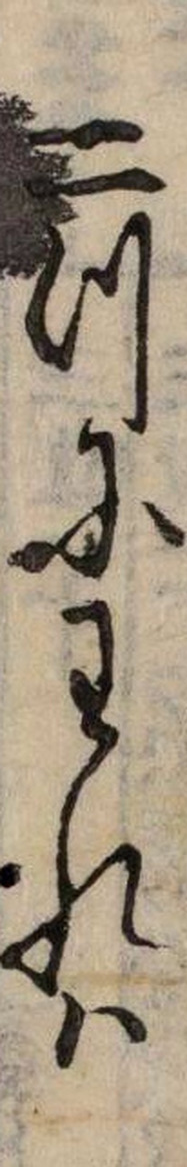二つにわれは
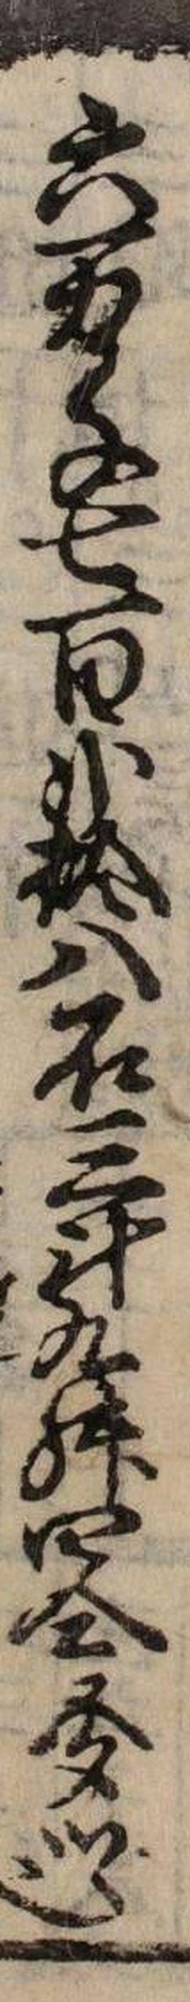六万千七百弍拾八石三斗九升四合五匁つ也
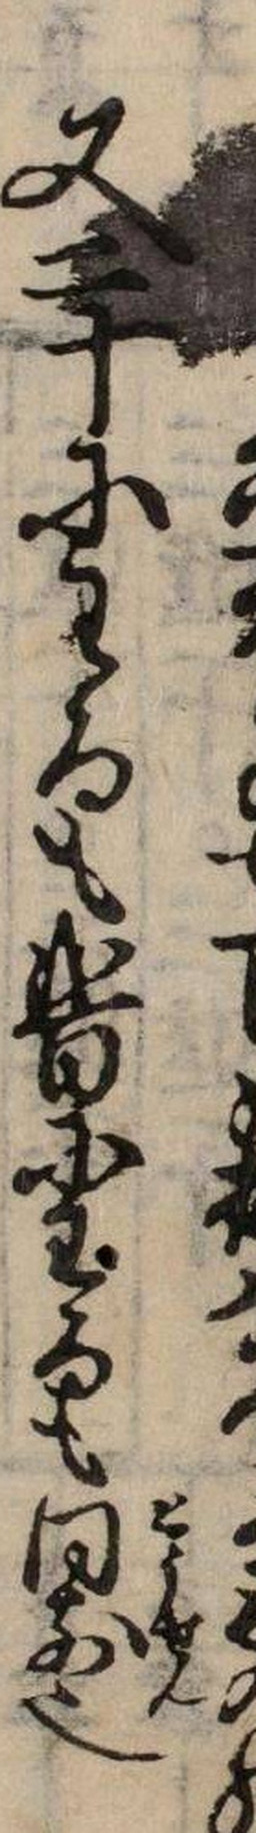又二十にわれるも弍百にわるも同前也
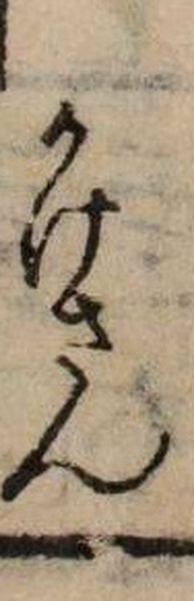かけさん

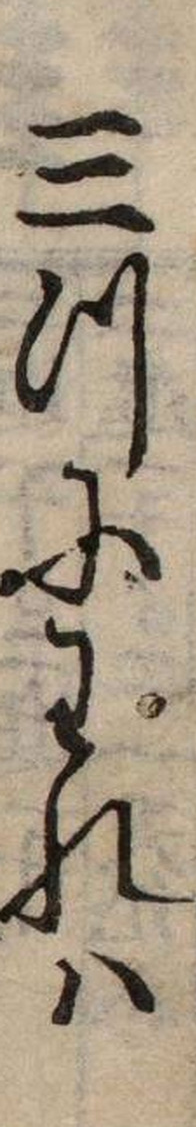三つにわれは
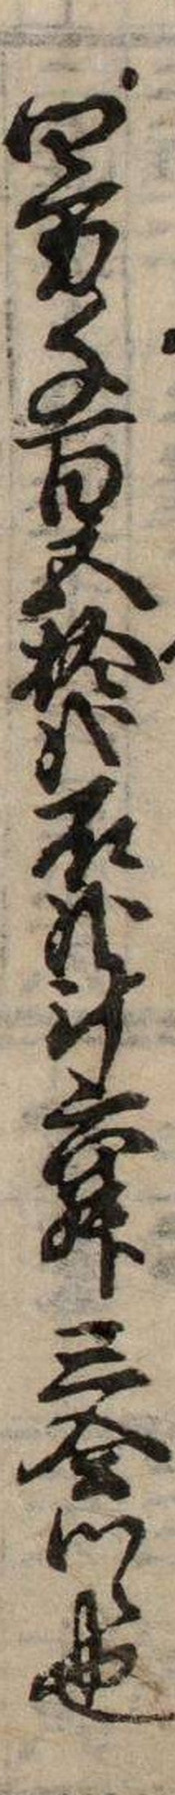四万千百五拾弍石弍斗六升三合つ也
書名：塵劫記（寛永11年自跋、京都府立京都学・歴彩館追貴8）
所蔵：京都府立京都学・歴彩館 国文学研究資料館
